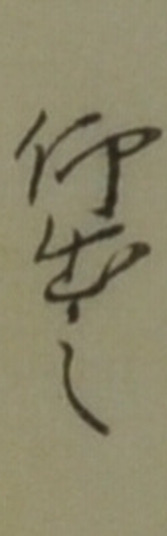仰出之
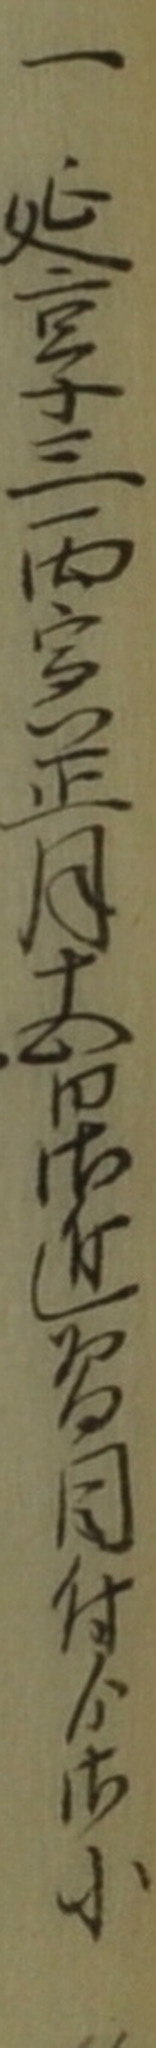一延享三丙寅正月十五日御近習目付ゟ御小
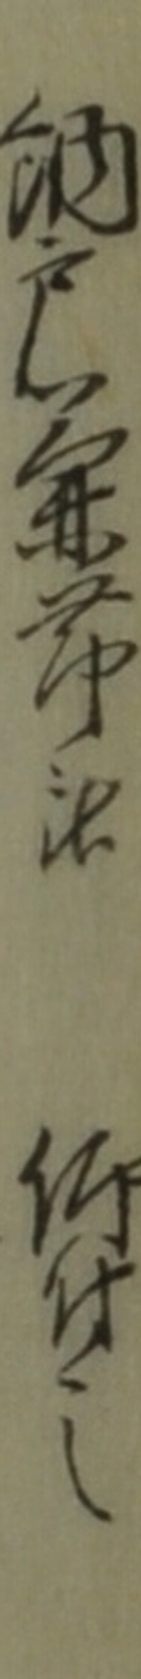納戸兼帯被仰付之
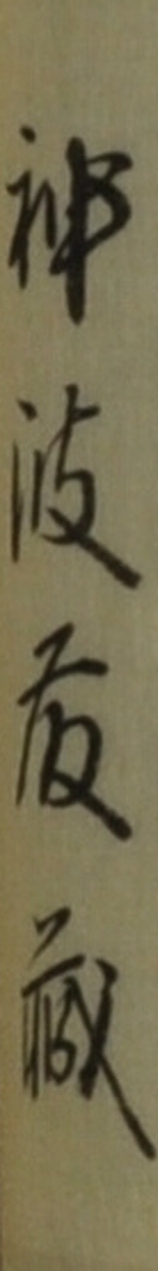神波藤蔵
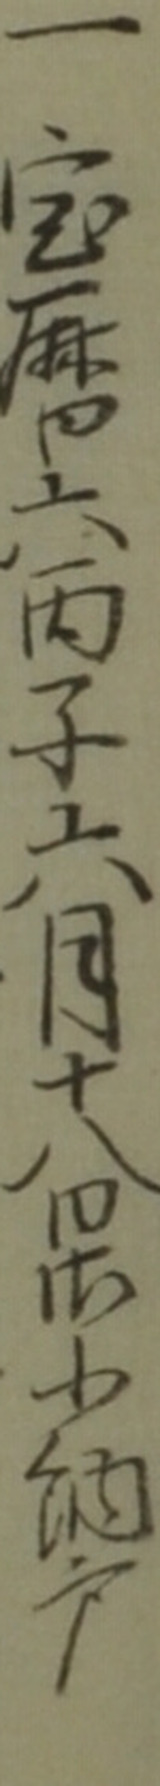一宝暦六丙子六月十八日御小納戸
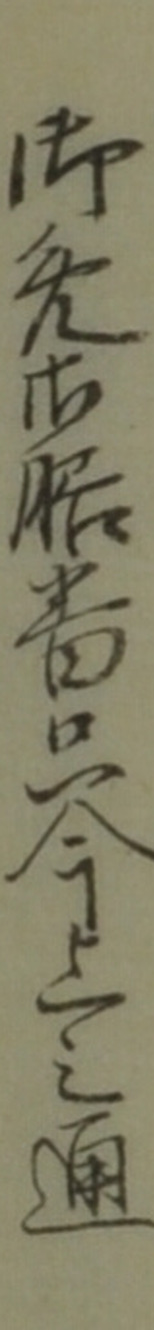御免御膳番只今迄之通
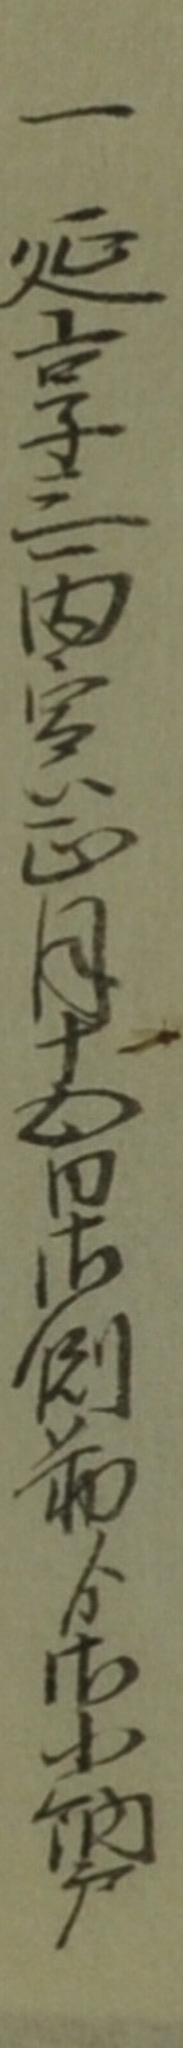一延享三丙寅正月十五日御側勤ゟ御小納戸
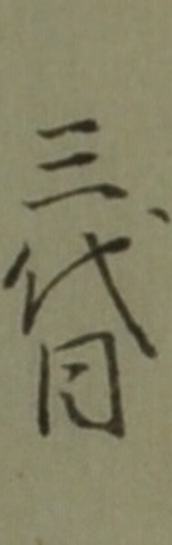三代目
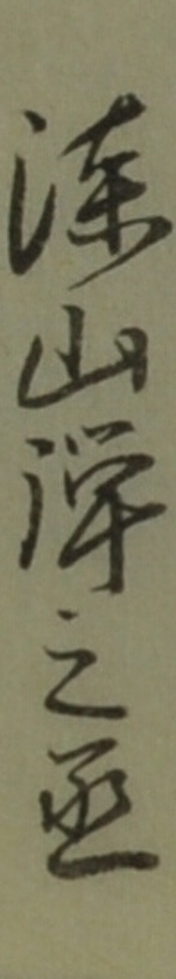漆山弾之丞
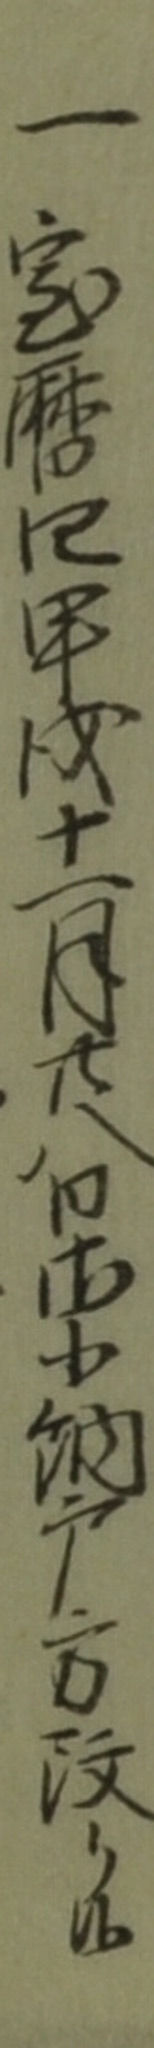一宝暦四甲戌十一月廿八日御小納戸方改リ候
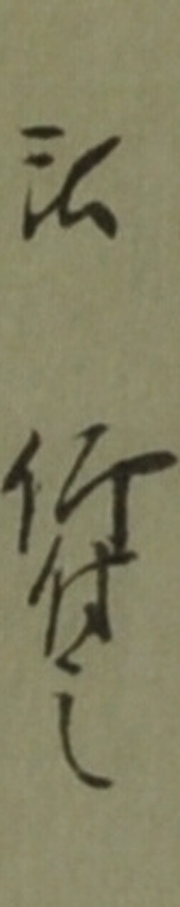被仰付之
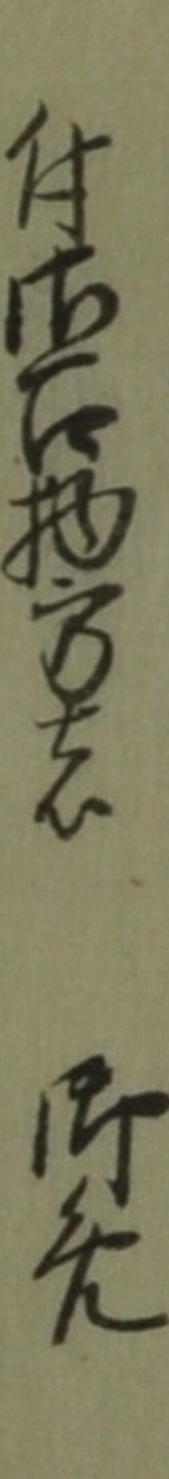付御召物方者御免
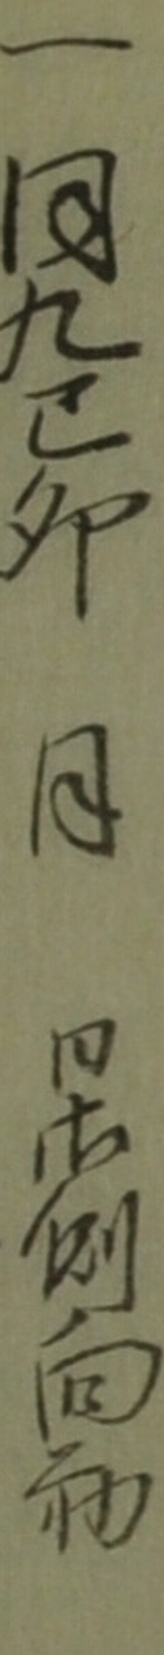一同九己卯月日御側向勤
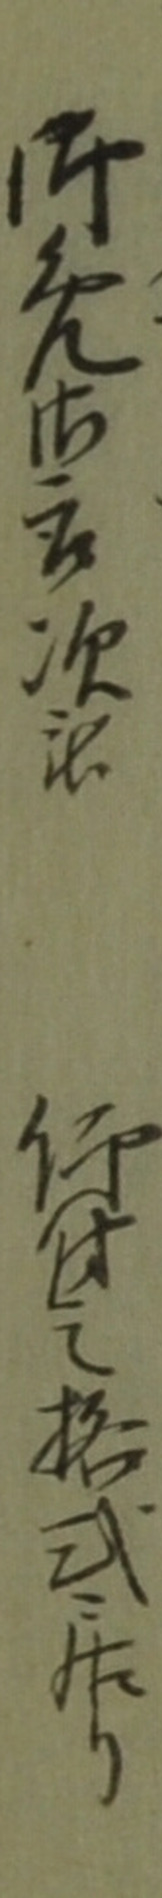御免御取次被仰付之格式居リ
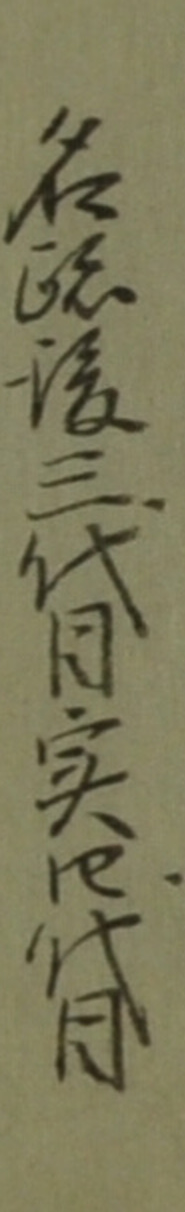名跡後三代目実四代目
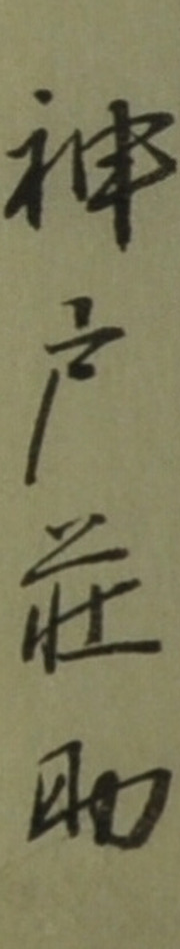神戸庄助
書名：諸御役代々録（四）
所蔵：伊那市立高遠町図書館・合同会社AMANE
